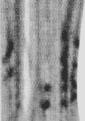谷（欲）
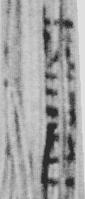○（隨）
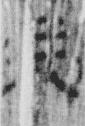而
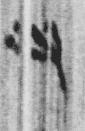又（有）
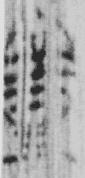豊（禮）
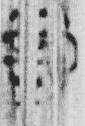言
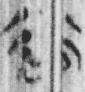谷（欲）
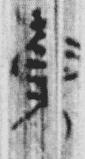植（直）
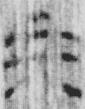而
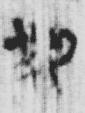母
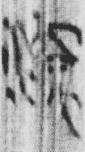流
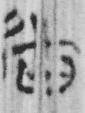居
